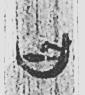曰
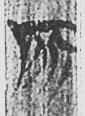所
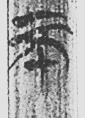不
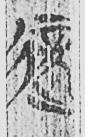復
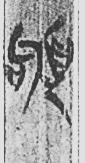{句頁}
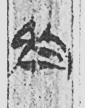於
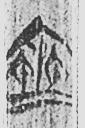齊
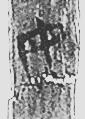母
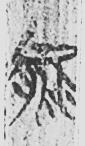能
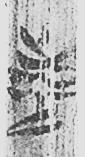涉
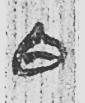白
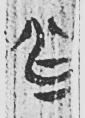水
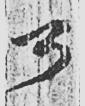乃
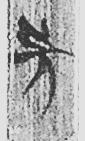先
